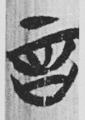言
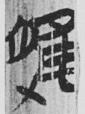○（脽）
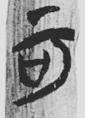可（何）
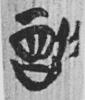○[訛（過）]
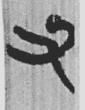又（有）
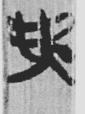○（焉）
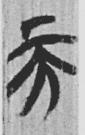天
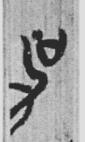加
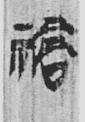禍
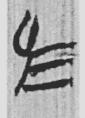於
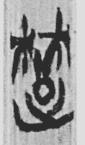楚
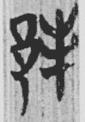邦
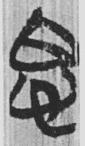○（霸）
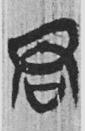君
